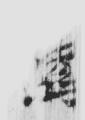灋
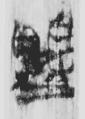{興止}
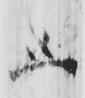之
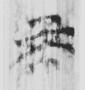不
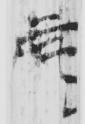厇
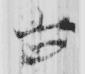古
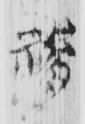禍
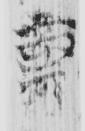福
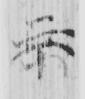不
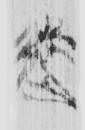遠
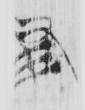𦘔
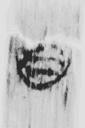自
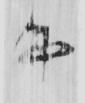身
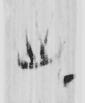出
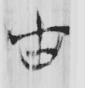古
